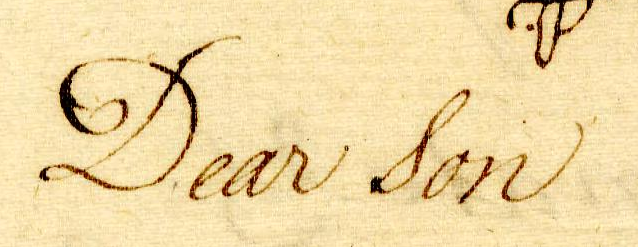Dear Son
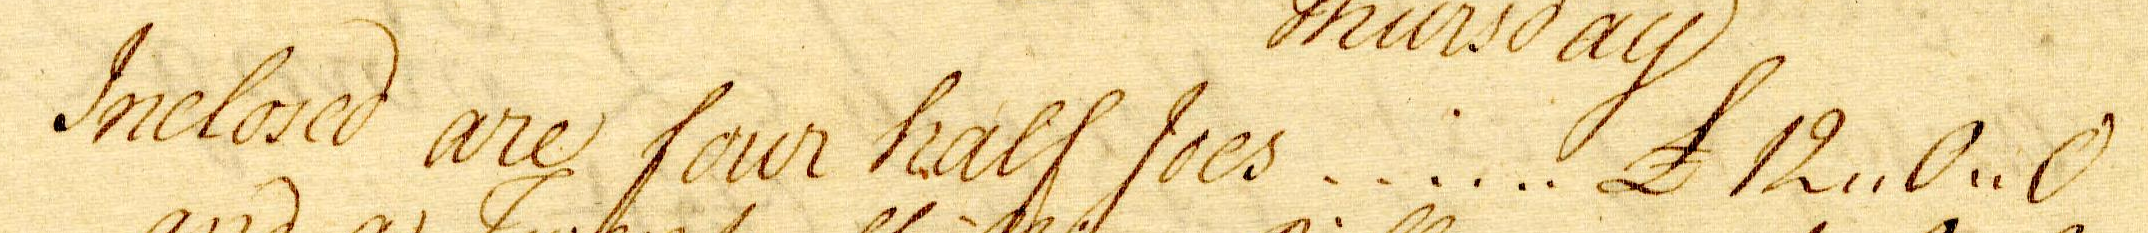Inclosed are four half Joes...... £12..0..0
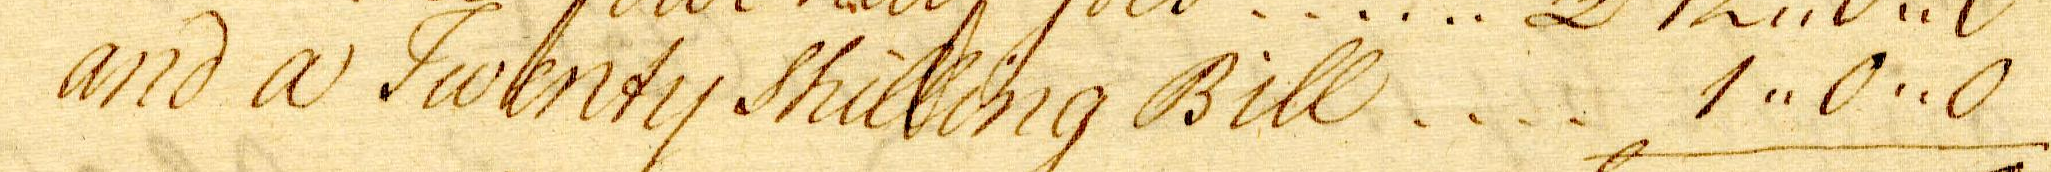and a Twenty Shilling Bill....1..0..0
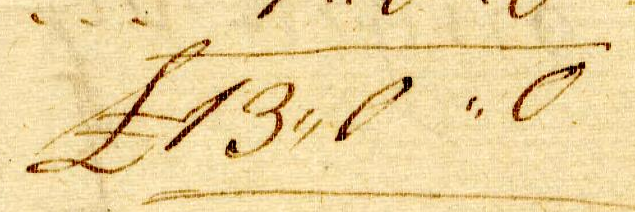£13..0..0
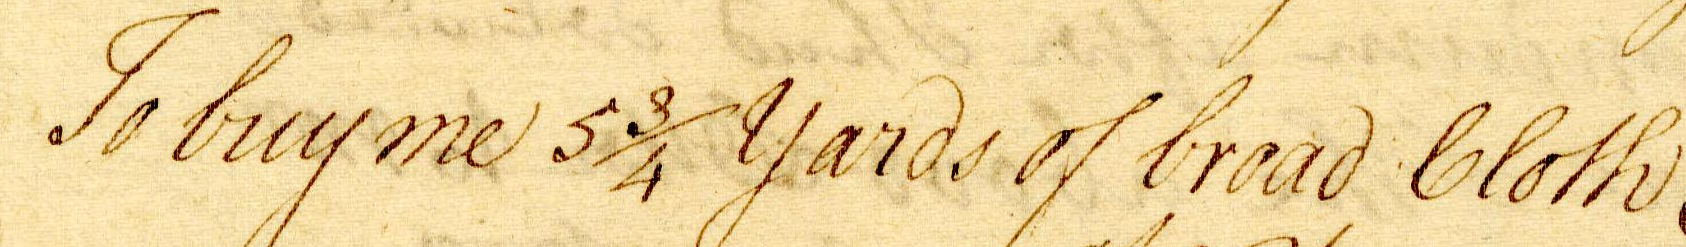To buy me 5 3/4, Yards of broad Cloth
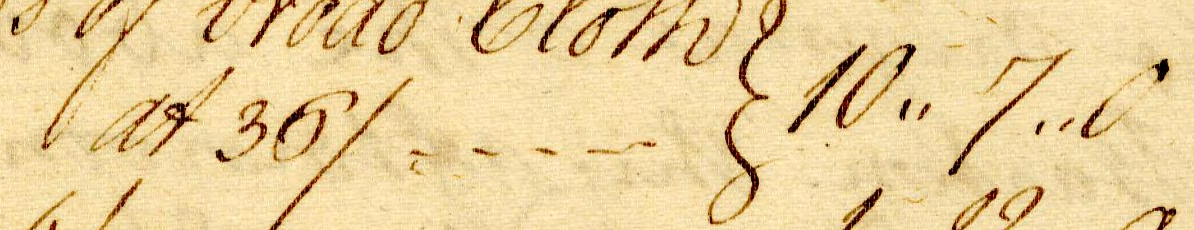at 36s.....10..7..0
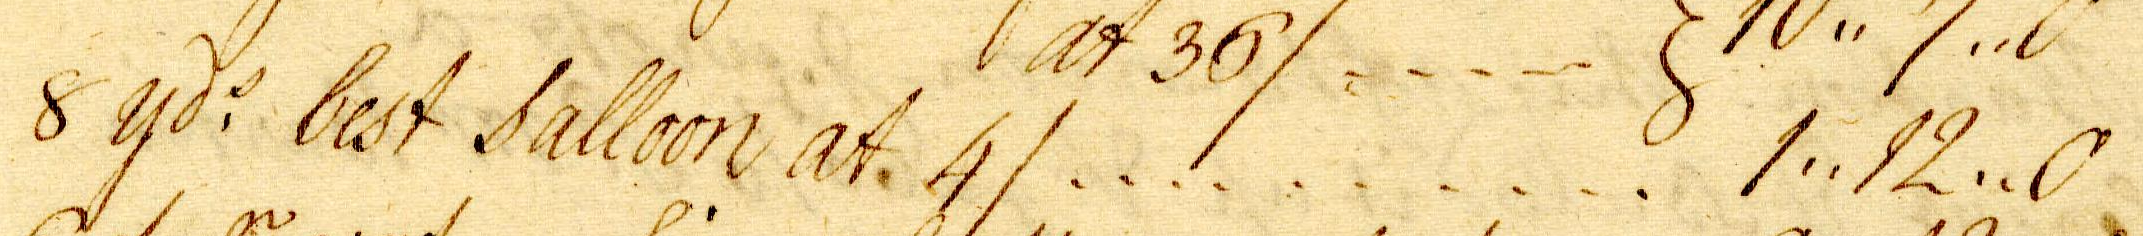8 yd^s. best Salloon at 4s.......... 1,,12,,0
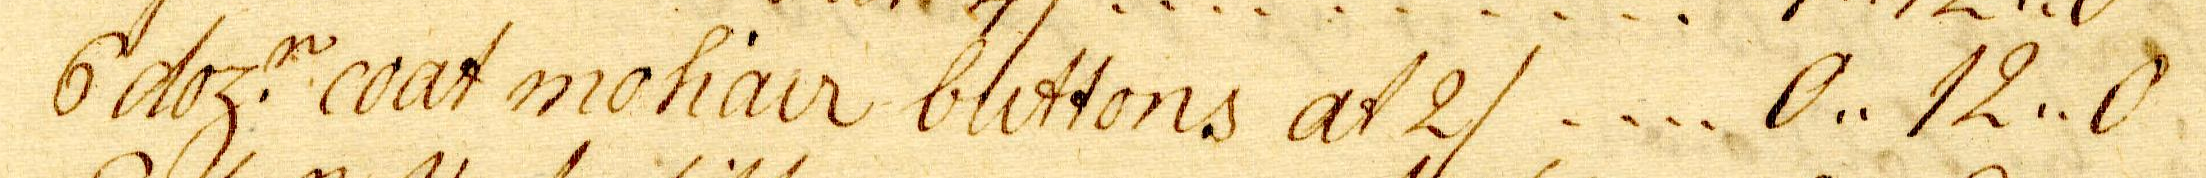6 doz^n. coat mohair buttons at 2s.... 0..12.0
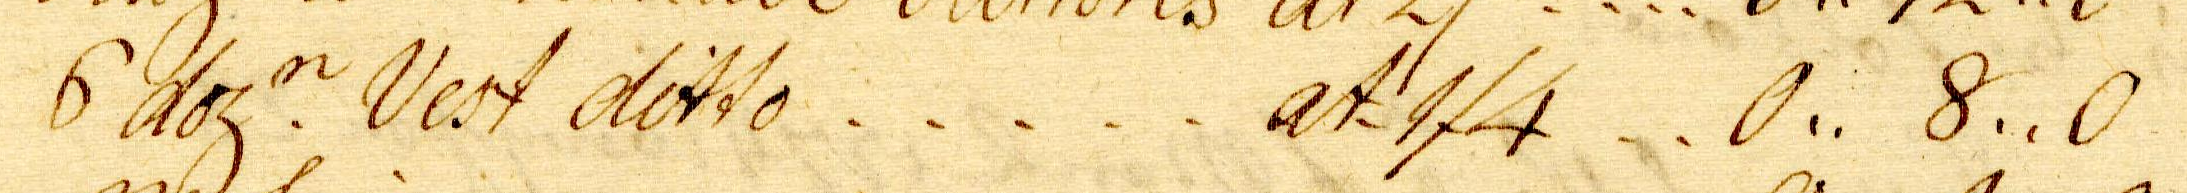6 doz^n. Vest ditto..... at-4s4.. 0..8..0
